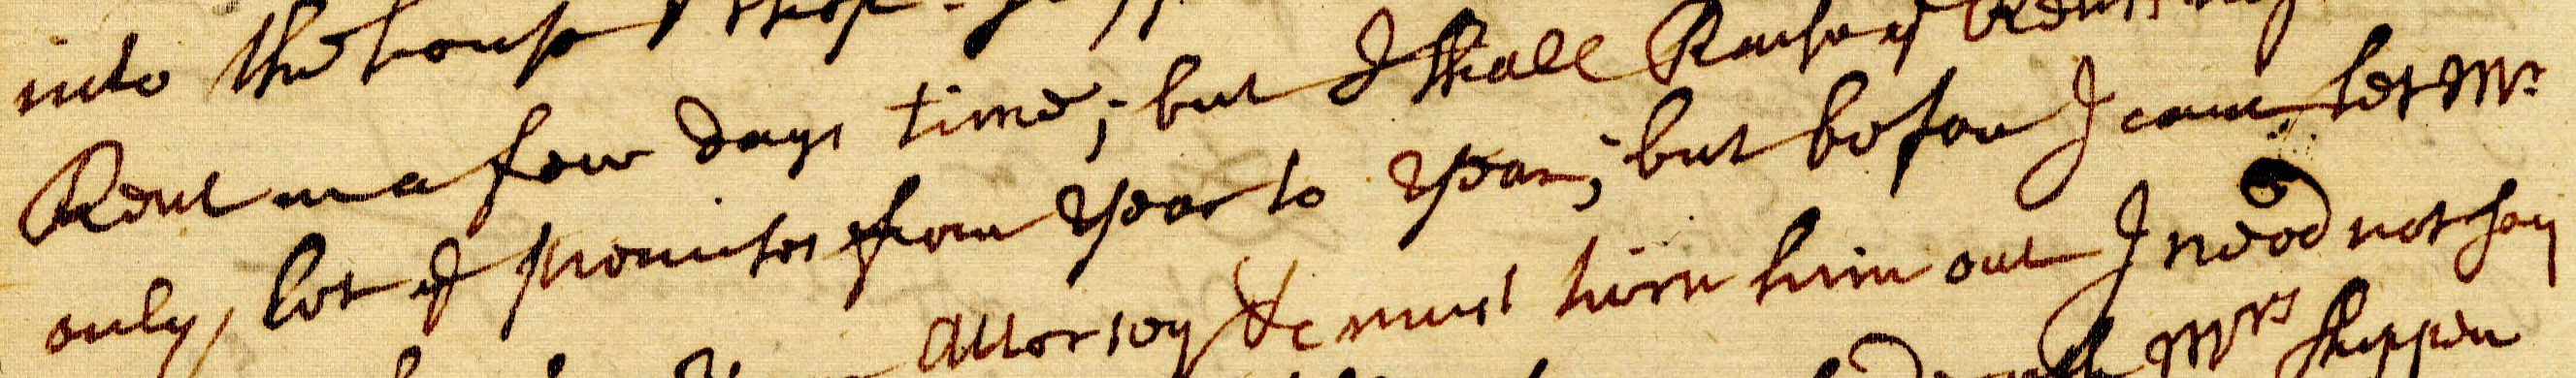only Cut y^e promises from Year to Year; but before I can let M^r
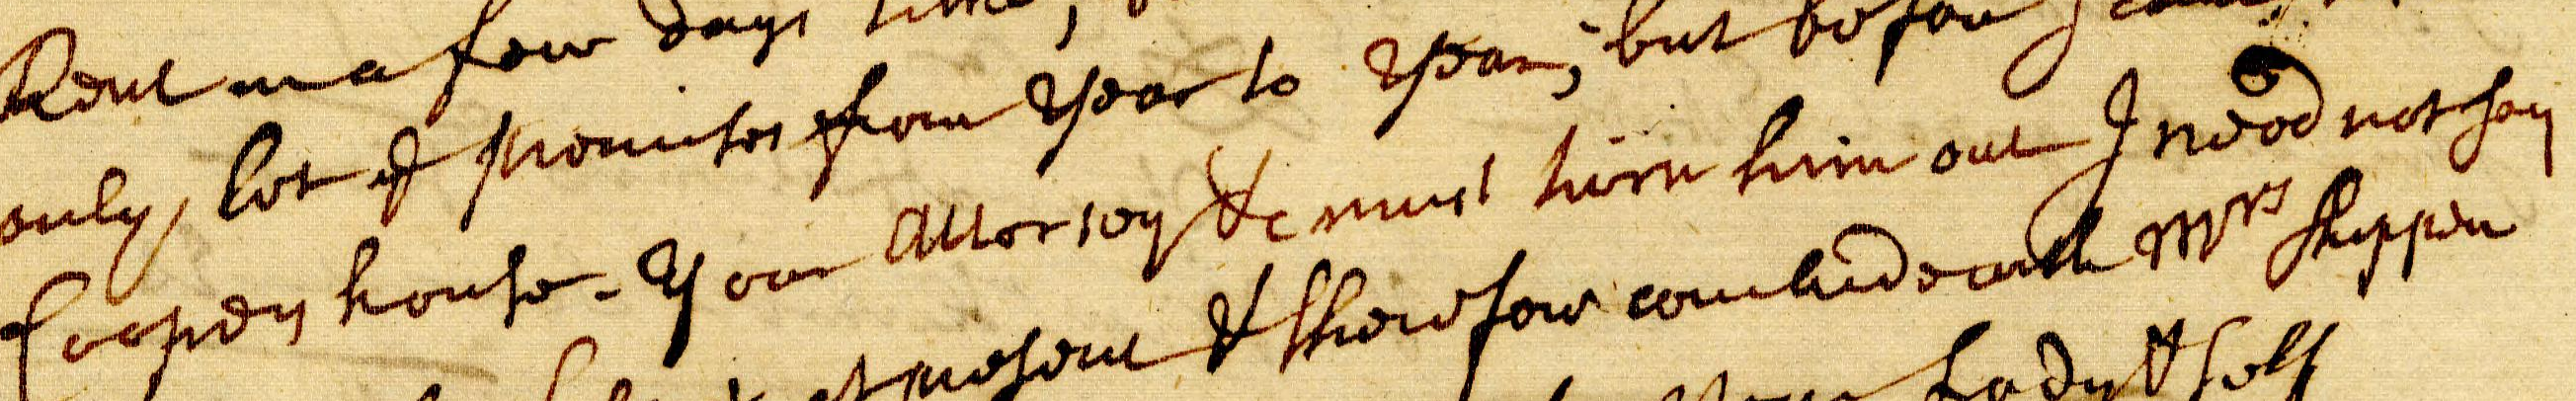Coopers house-Your Attorney &c must turn him out I need not say
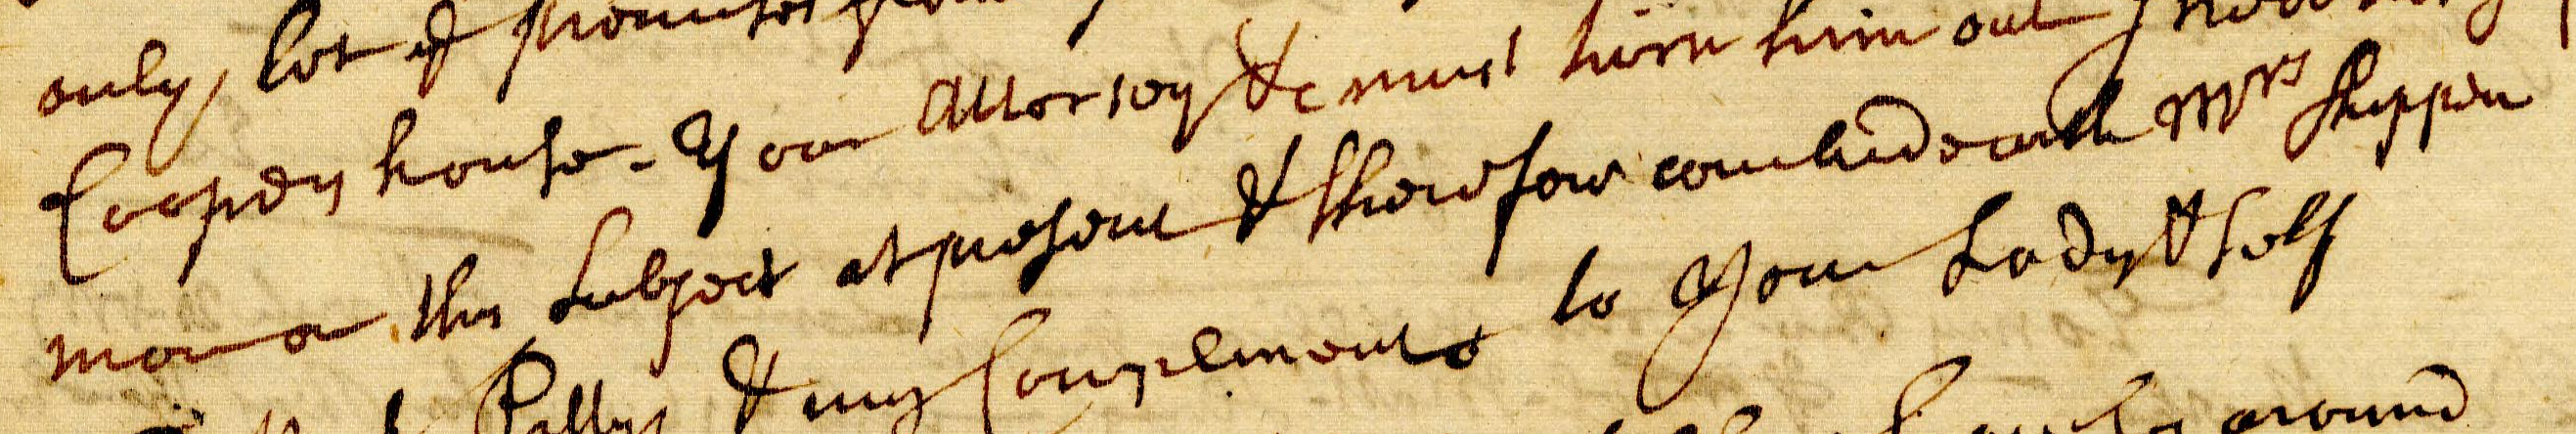more on this subject at present & therefor conclude with M^rs Shippen
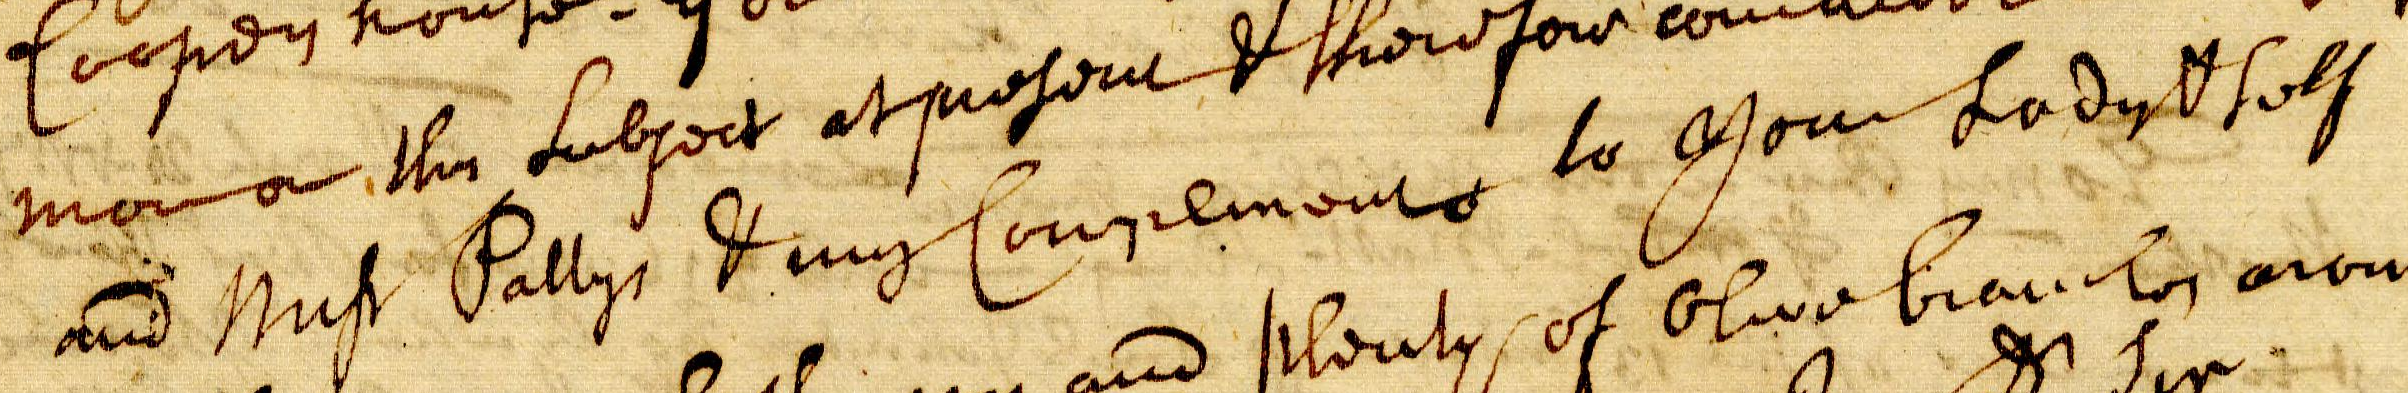and Miss Pattys & my Compliments to Your Lady & Self
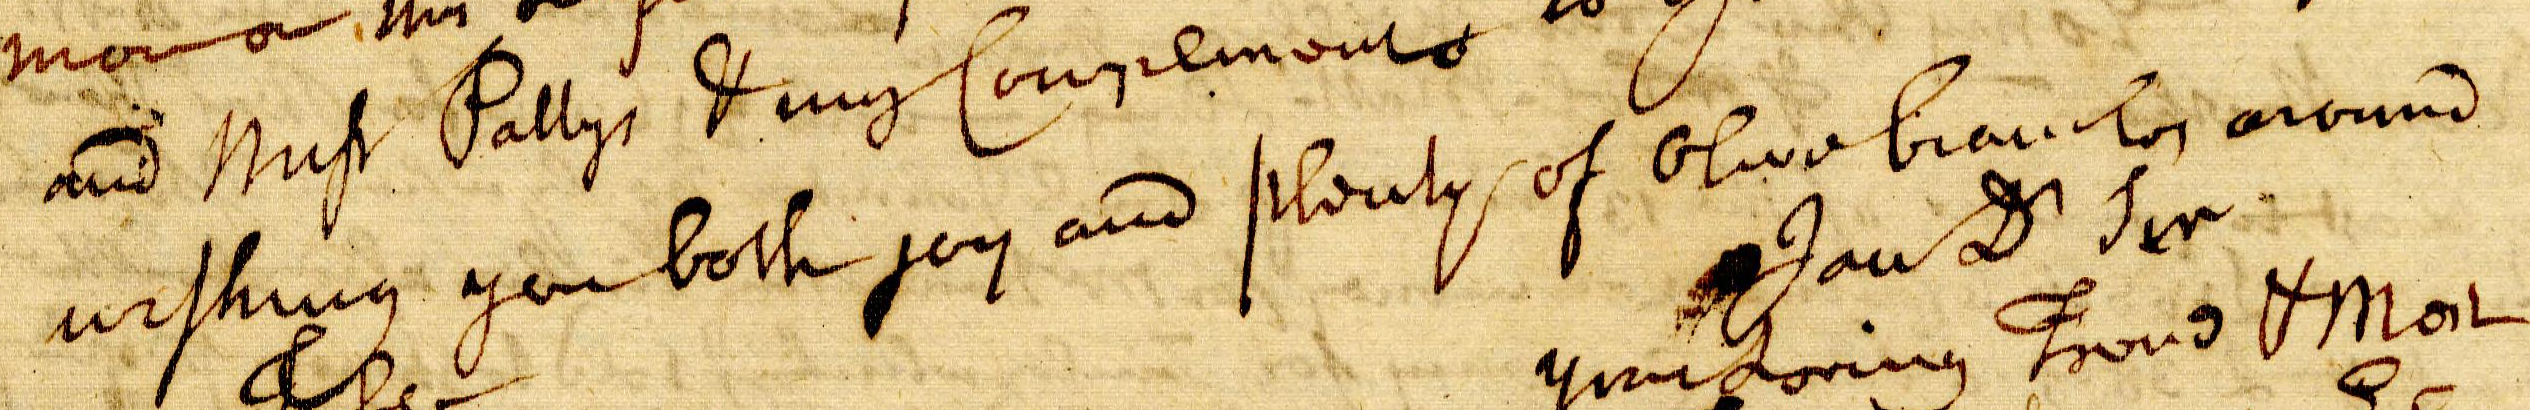wishing you joy and plenty of Olive branches around
